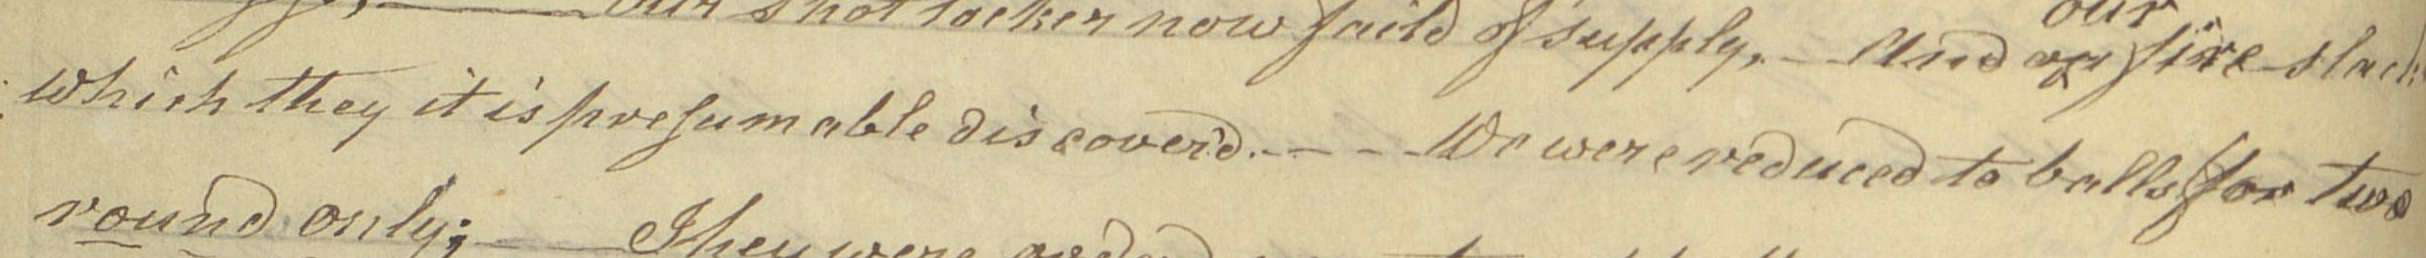which they it is presumable discoverd. We were reduced to balls for two
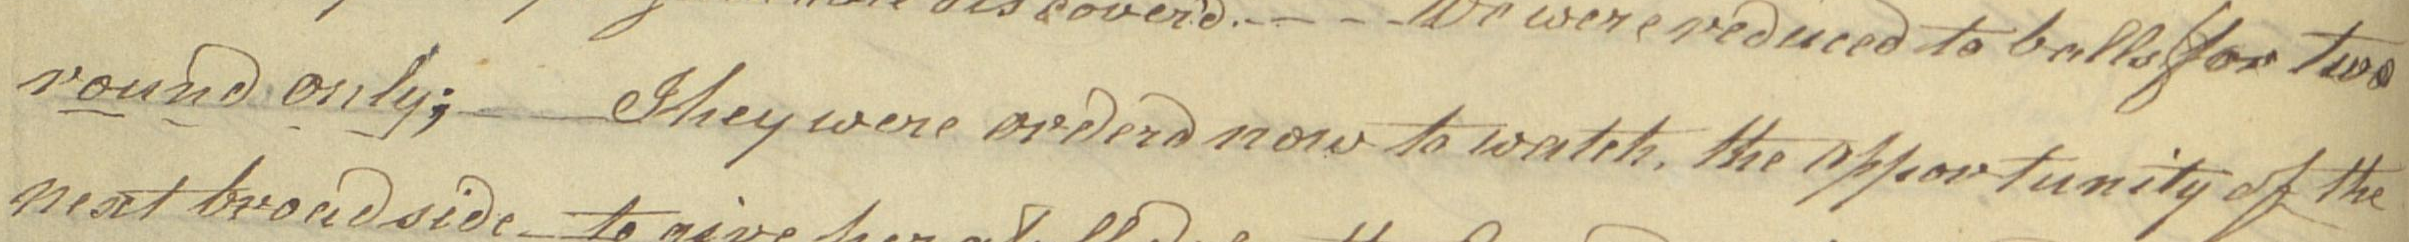round only; They were orderd now to watch. the opportunity of the
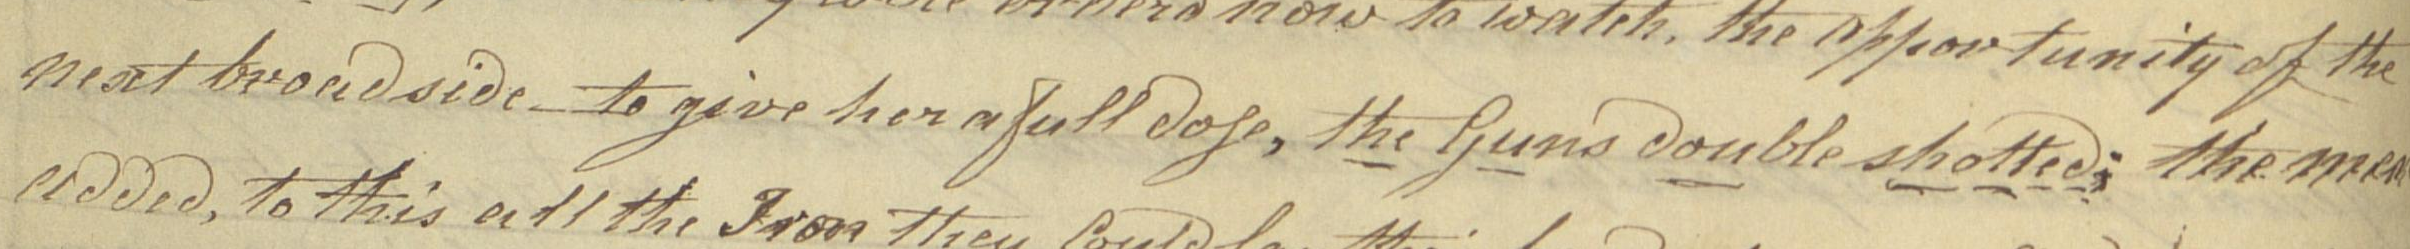next broadside to give her a full dose, the Guns double shotted; the men
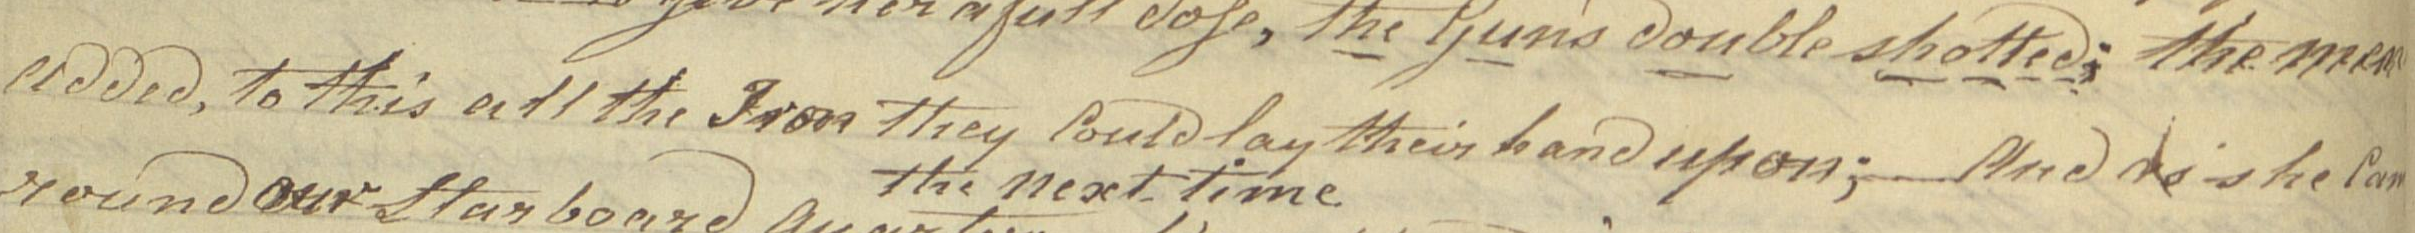Added, to this all the Iron they could lay their hand upon; And as she Can
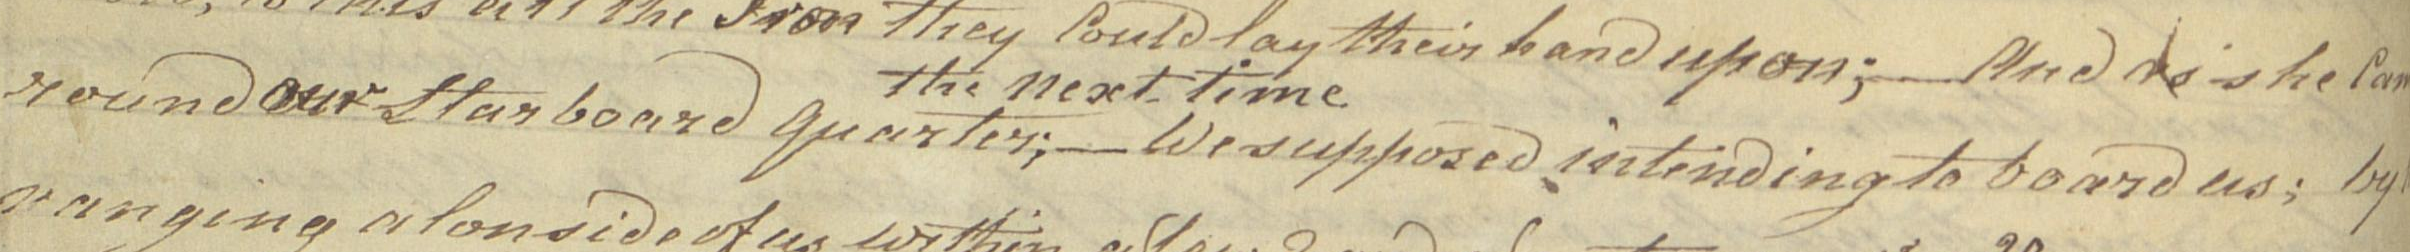round our Starboard quarter; We supposed intending to board us; by
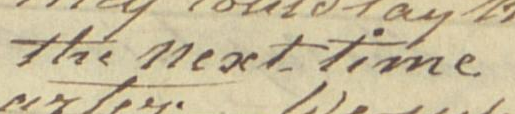the next time
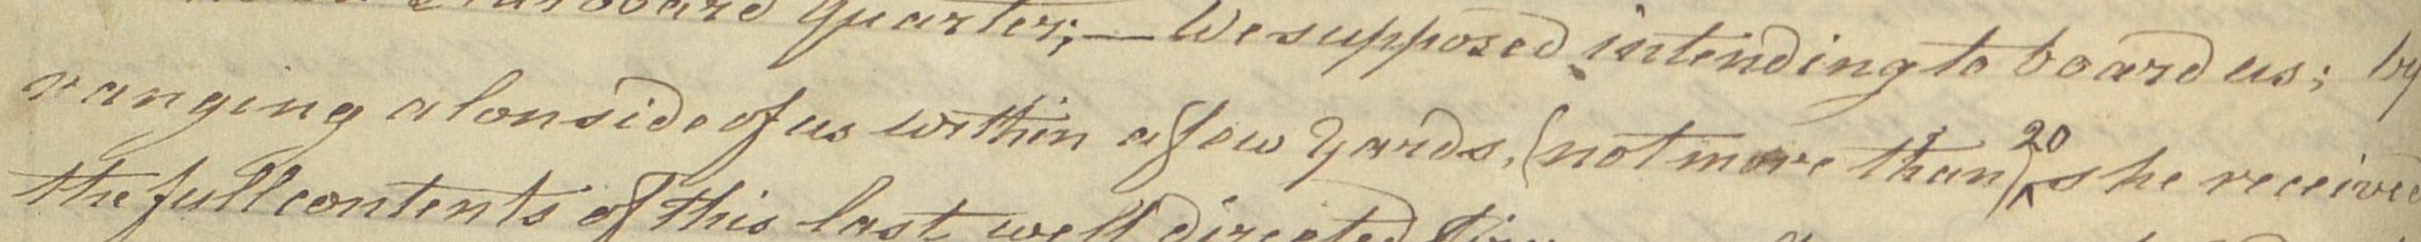ranging alonside of us within a few yards, (not more than ^ she received
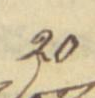20
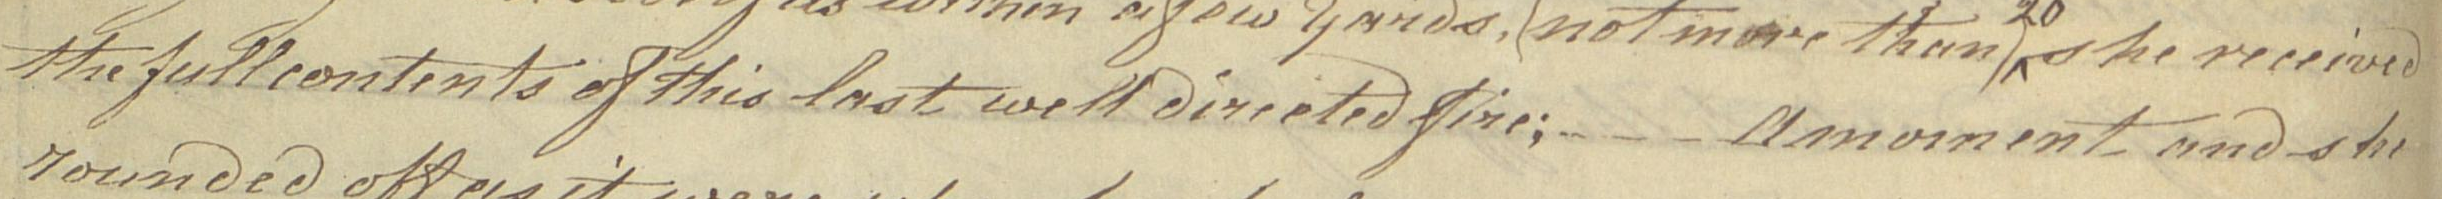the full contents of this last west directed fire; A moment and she
